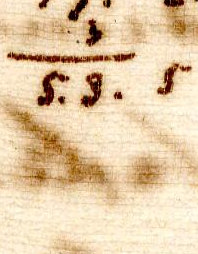53.5
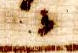3
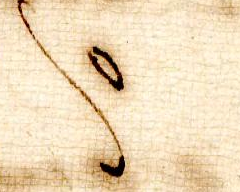To
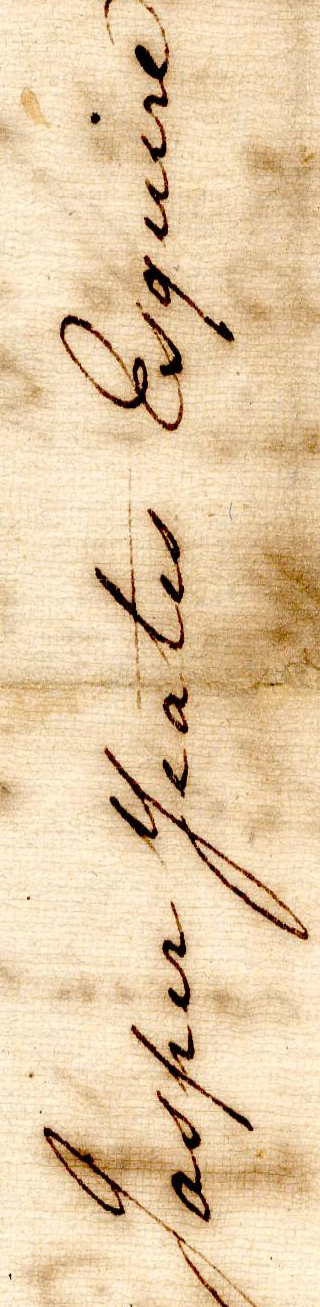Jasper Yeates Esquire
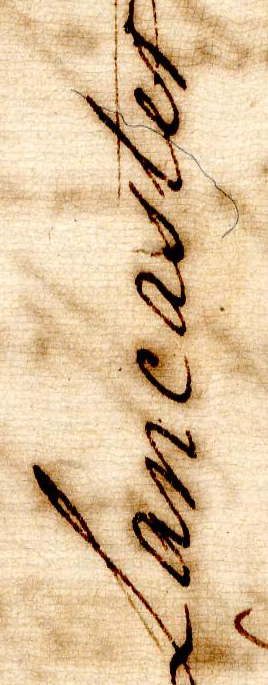Lancaster
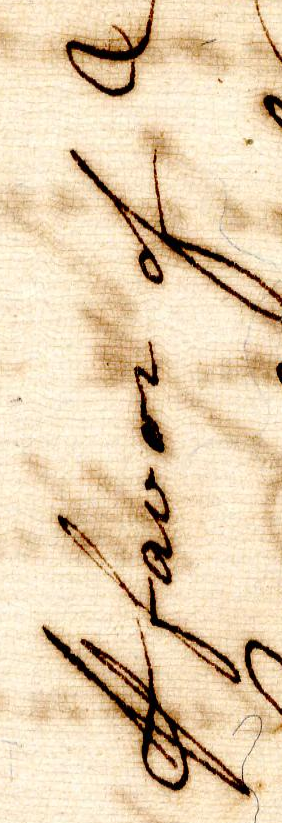Per favor of
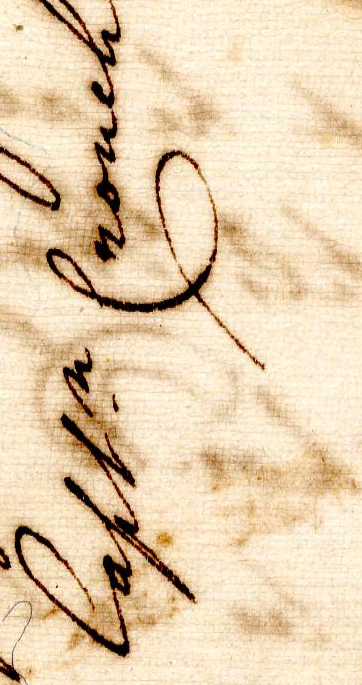Capt^n. Crouch
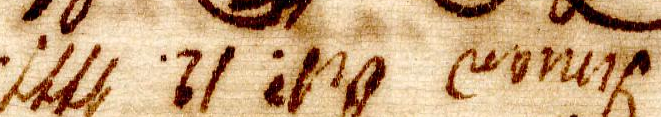Tinian Oct^r. 12. 1777.
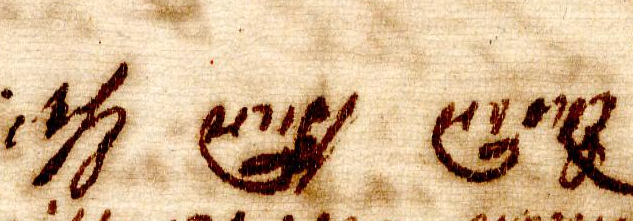Edward Burd Esq^r.
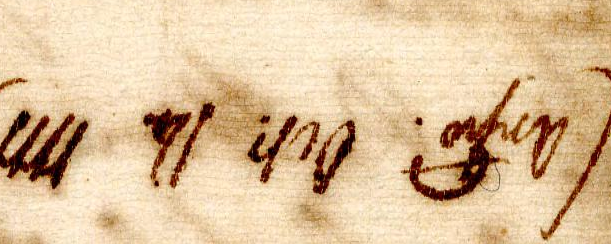(Answ^d. Oct^r. 14 1777)
